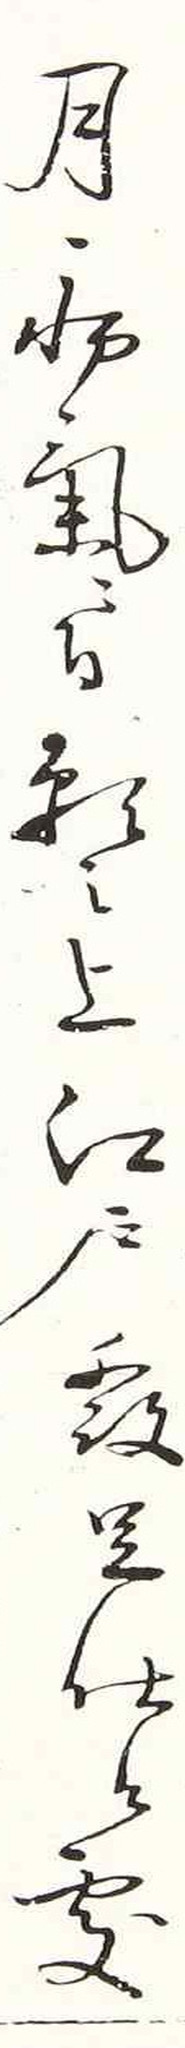月病気ニ付願之上江戸発足仕候処
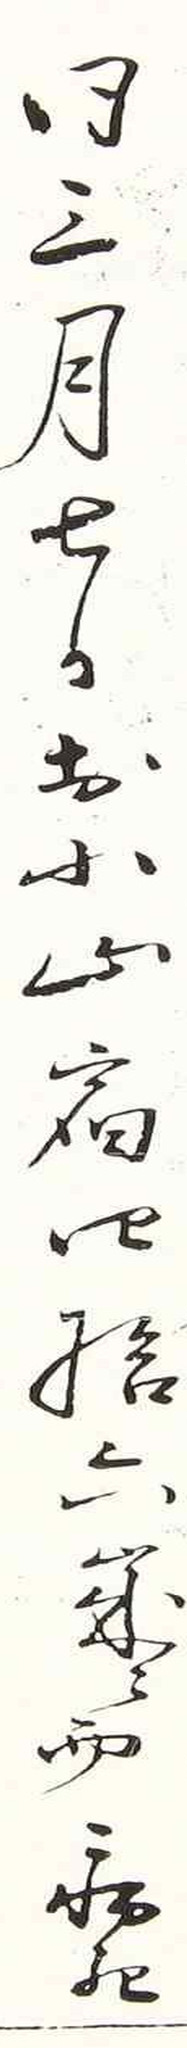同三月七日於小山宿四拾六歳ニ而病死
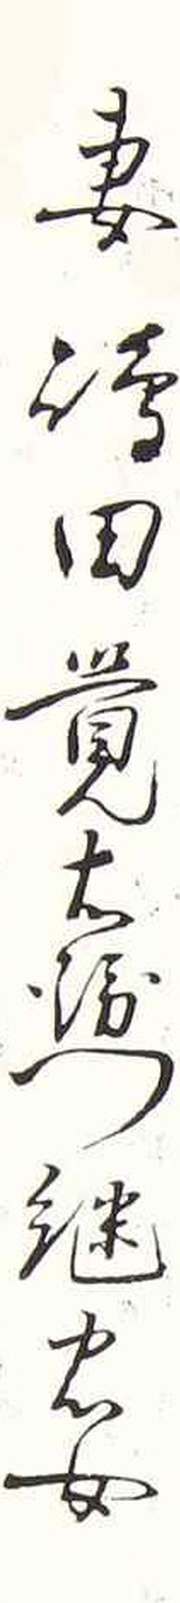妻島田覚右衛門継忠女
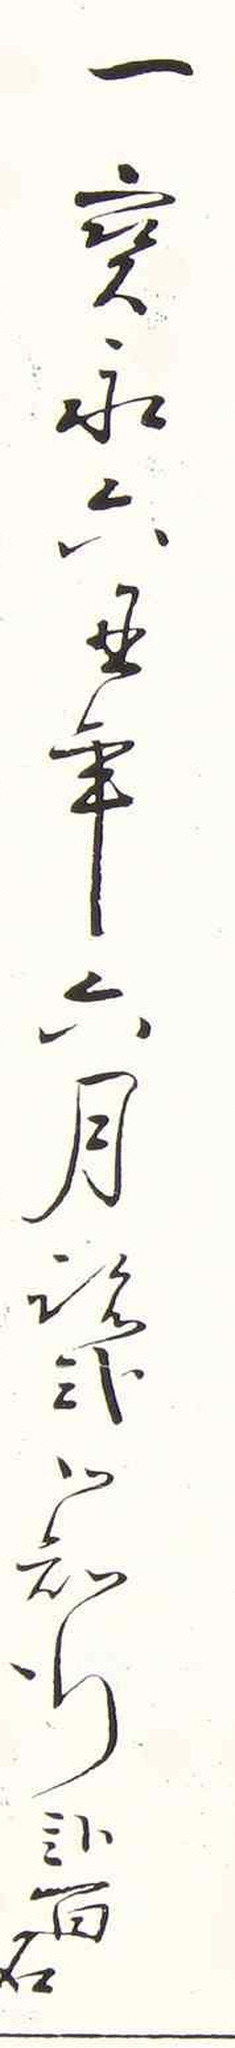一宝永六丑年六月跡式御知行弐百石
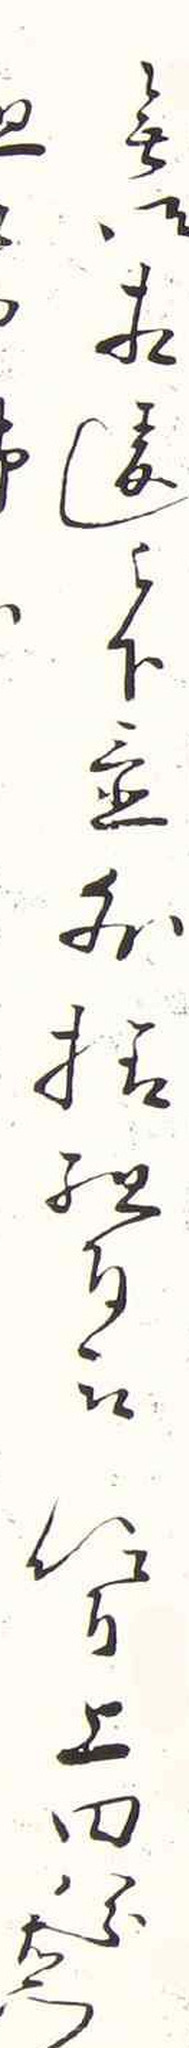無御相違被下置外様組付被仰付上田八郎右衛門
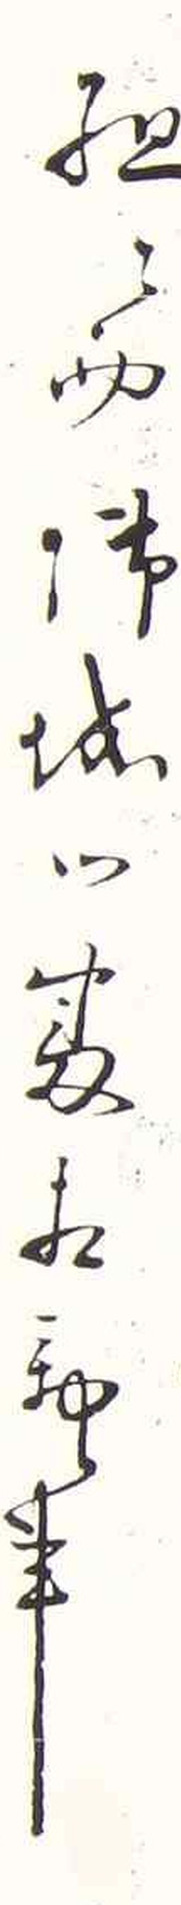組ニ而御城御番相勤候事

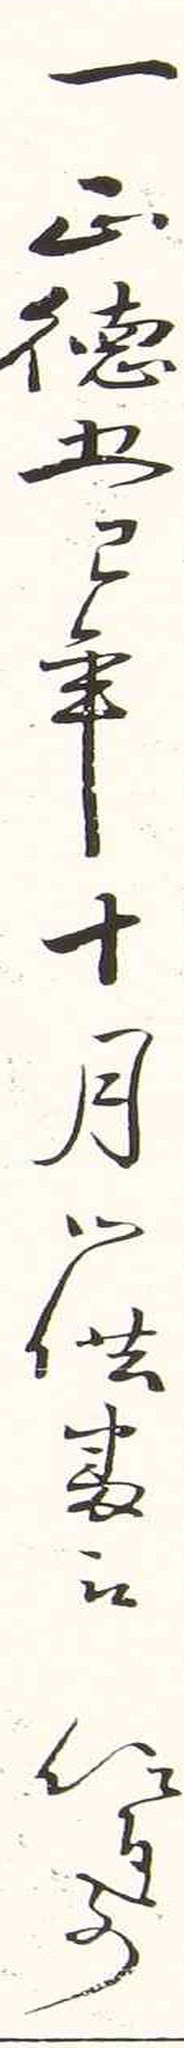一正徳五巳年十月御供番被仰付候事
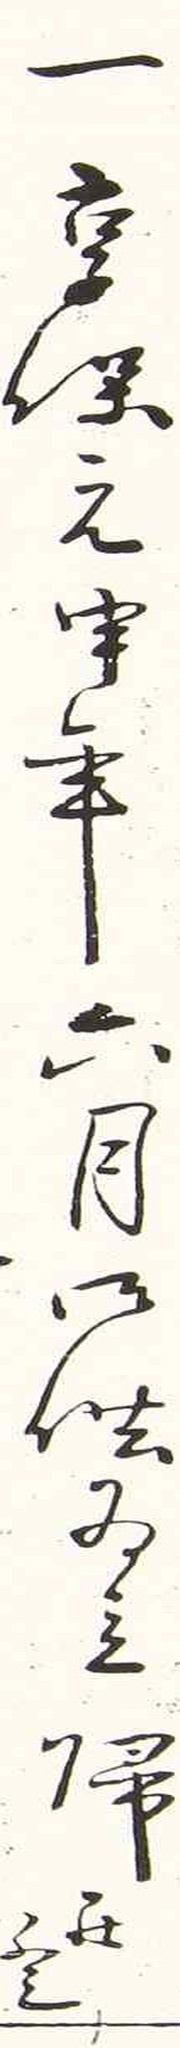一享保元申年六月御供為立帰罷登
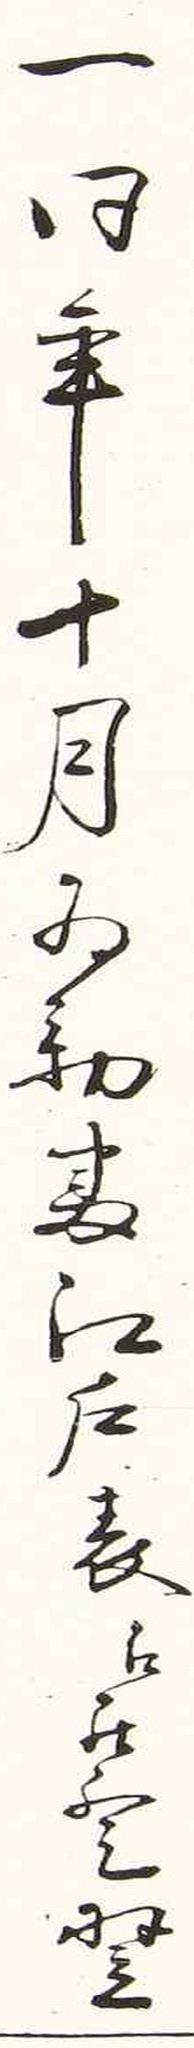一同年十月為勤番江戸表江罷登翌
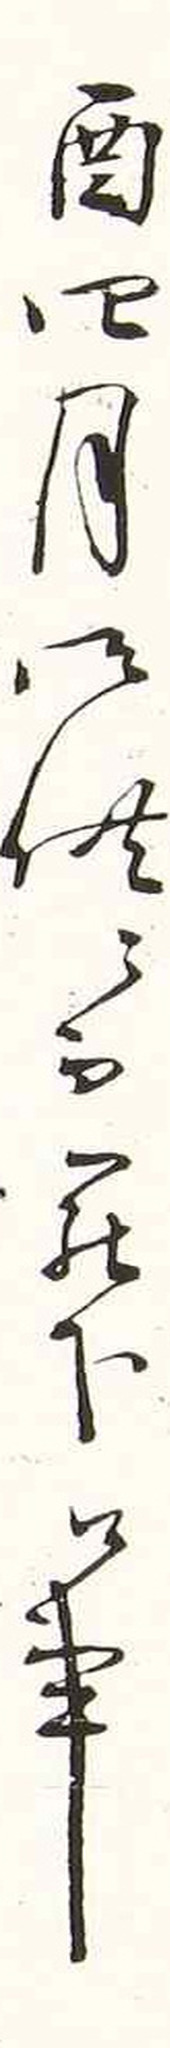酉四月御供ニ而罷下候事
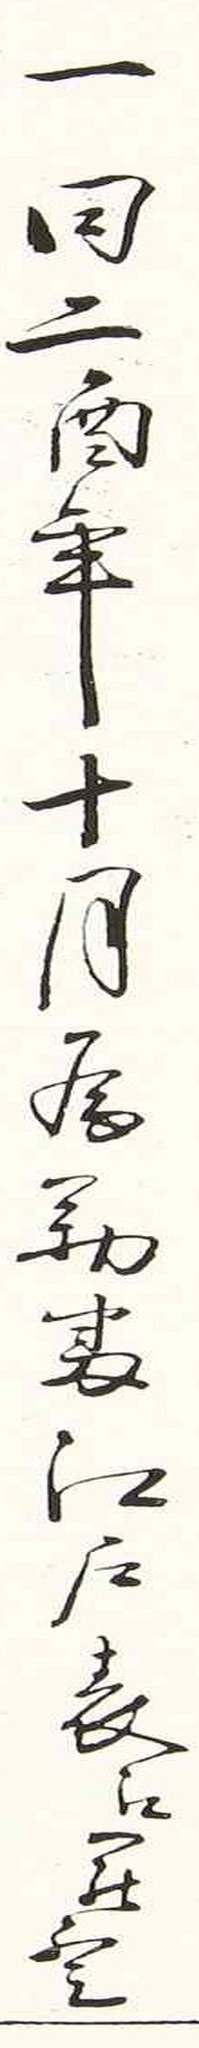一同二酉年十月為勤番江戸表江罷登
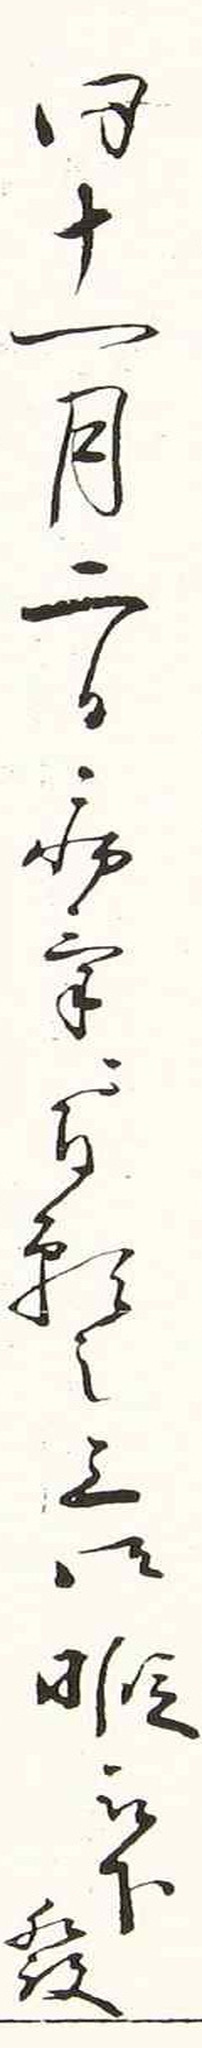同十一月二日病気ニ付願之上御暇被下発
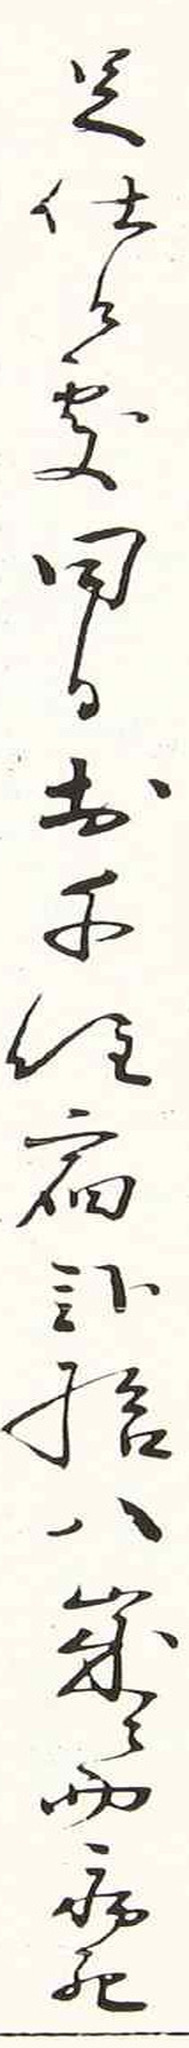足仕候処同日於千住宿弐拾八歳ニ而病死
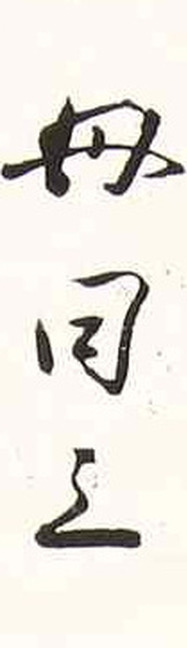母同上
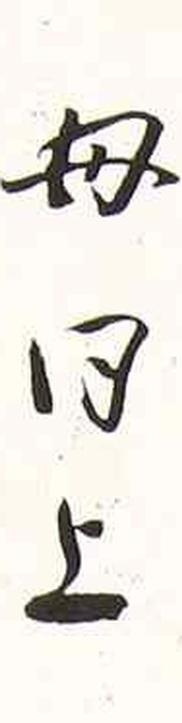母同上
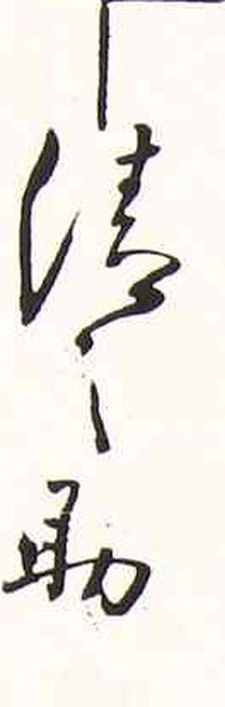清之助
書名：諸士系譜　巻之357　す之部7
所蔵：会津若松市立会津図書館
